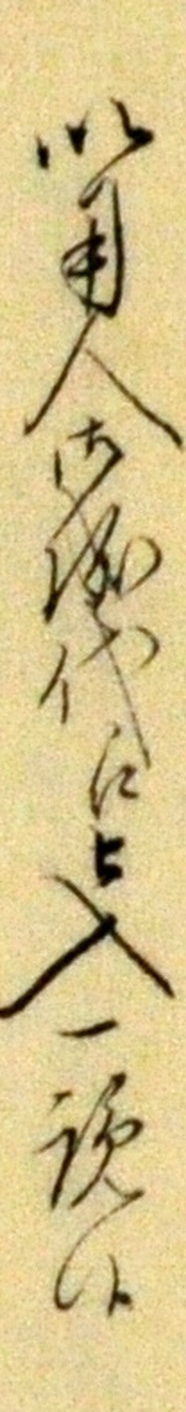以用人御城代え被入一覧候
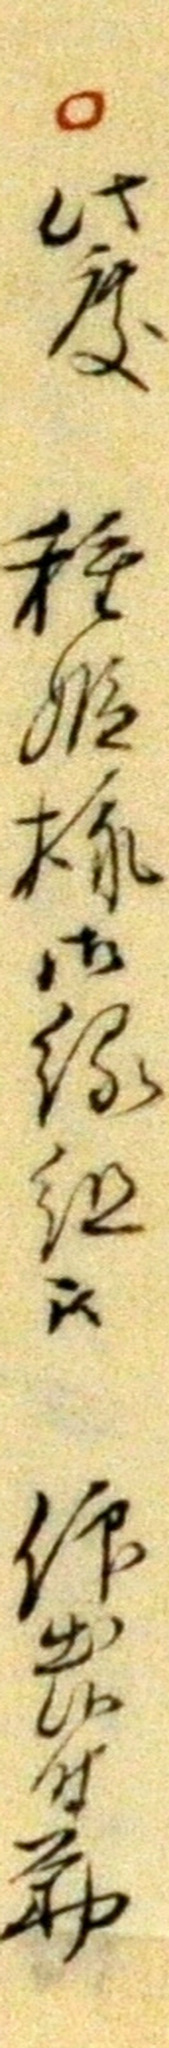此度種姫様御縁組被仰出候付勤
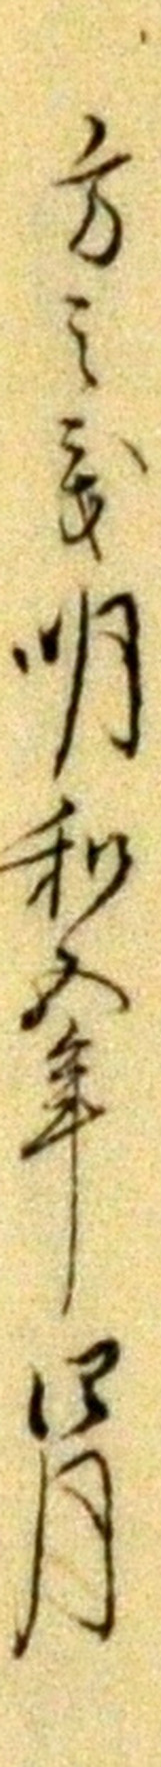方之義明和五年四月
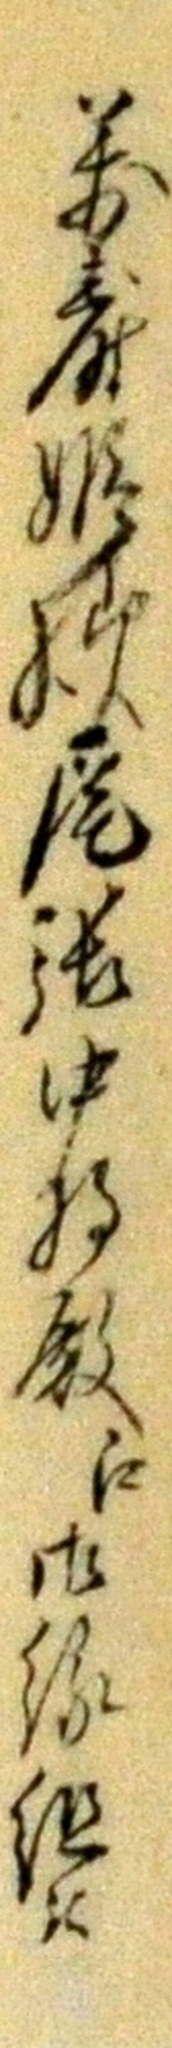萬寿姫様尾張中将殿え御縁組被
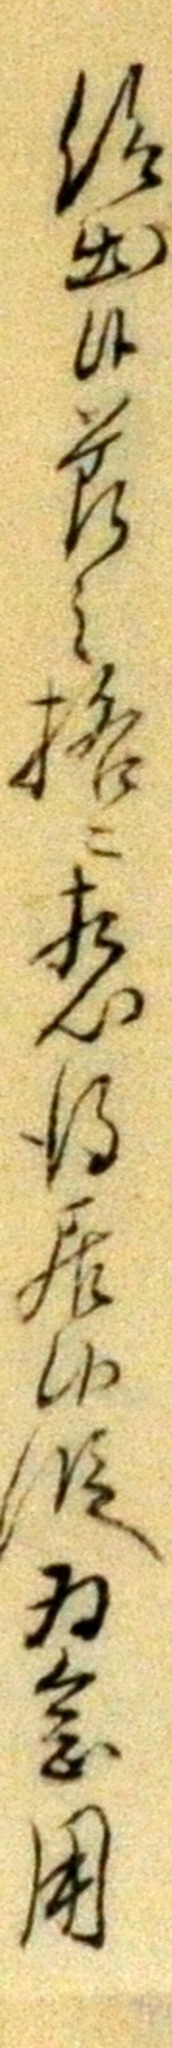仰出候節之格ニ相心得居候段為念用
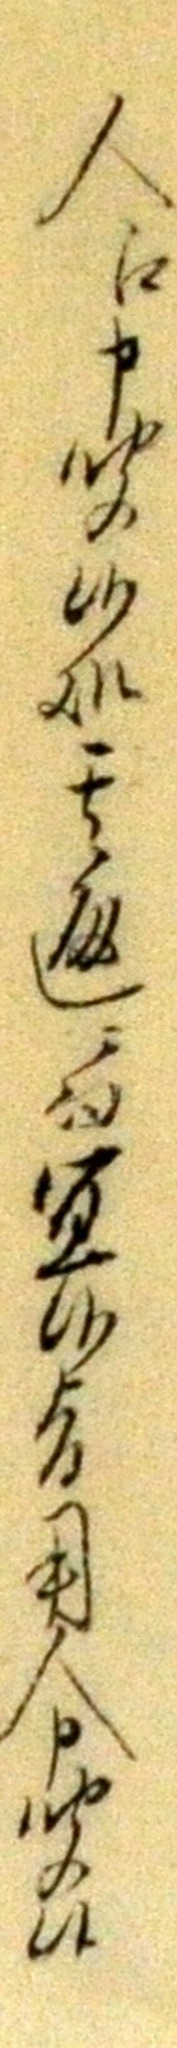人え申聞候処其通ニ而宜候旨用人申聞候
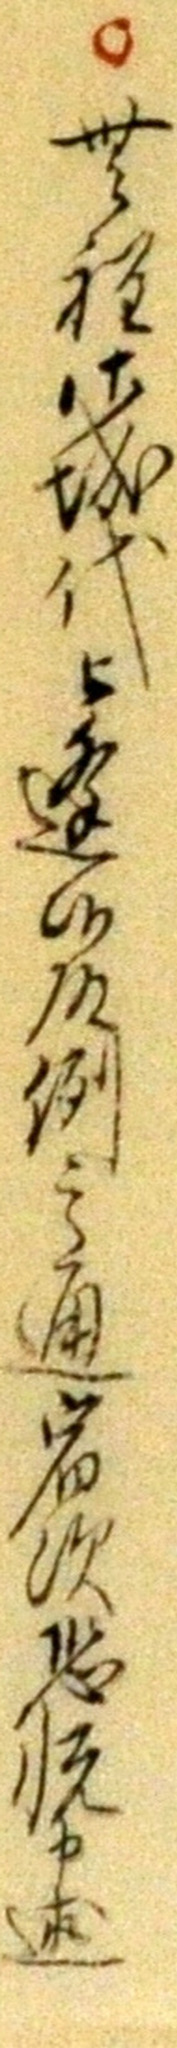無程御城代被逢候故例之通宿次恐悦申述
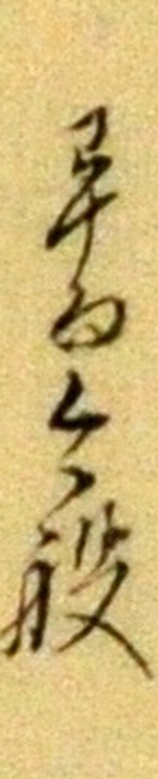畢而今般
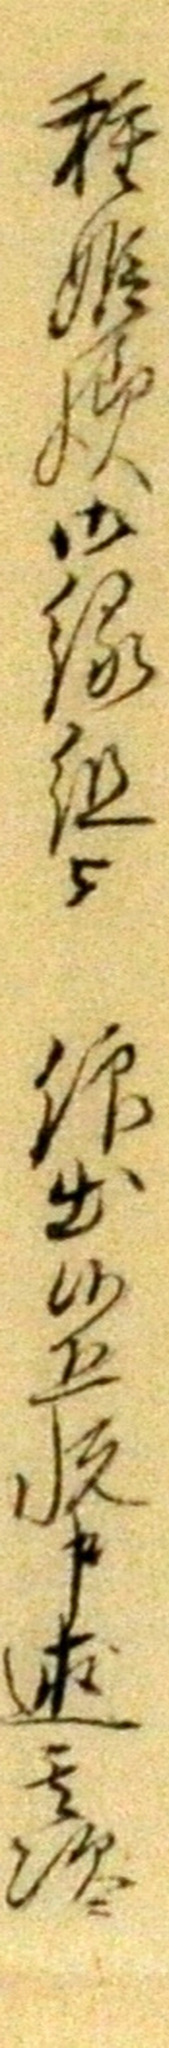種姫様御縁組被仰出候恐悦申述其次ニ
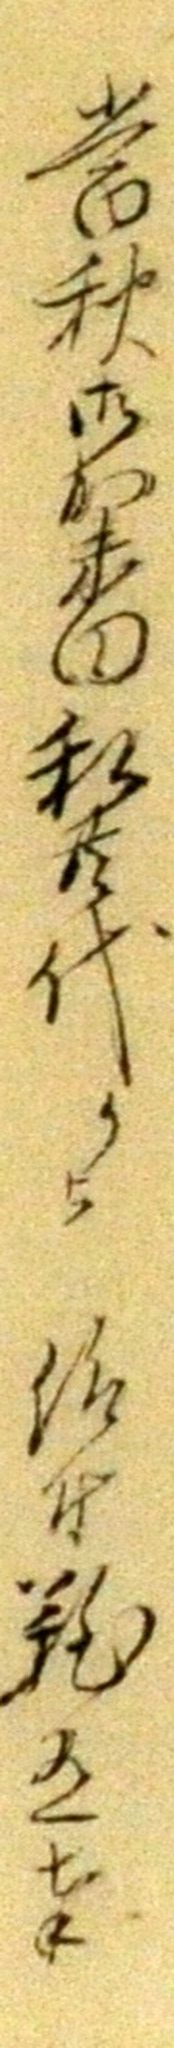当秋御加番私共代り被仰付難有奉
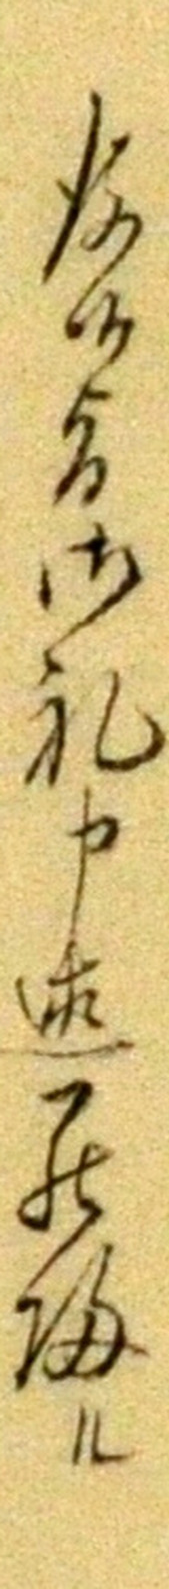存候旨御礼申述罷帰ル
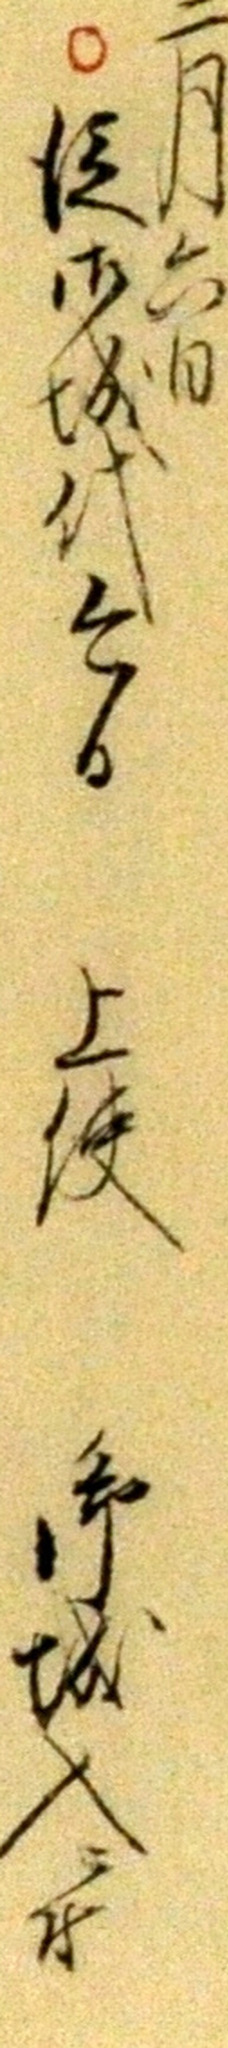従御城代今日上使御城入ニ付
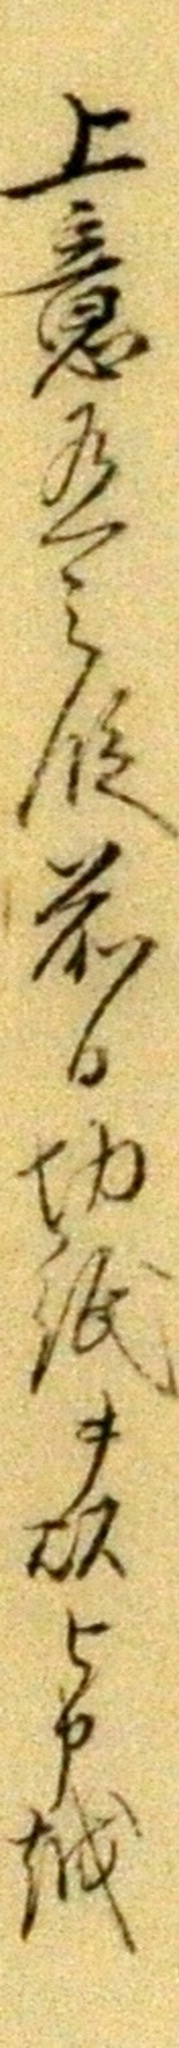上意有之段前日切紙ヲ以被申越
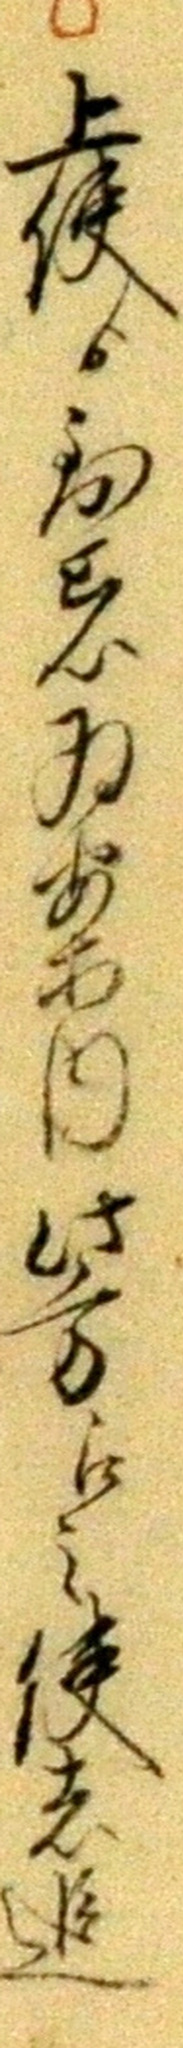上使ゟ到着為案内此方え之使者追
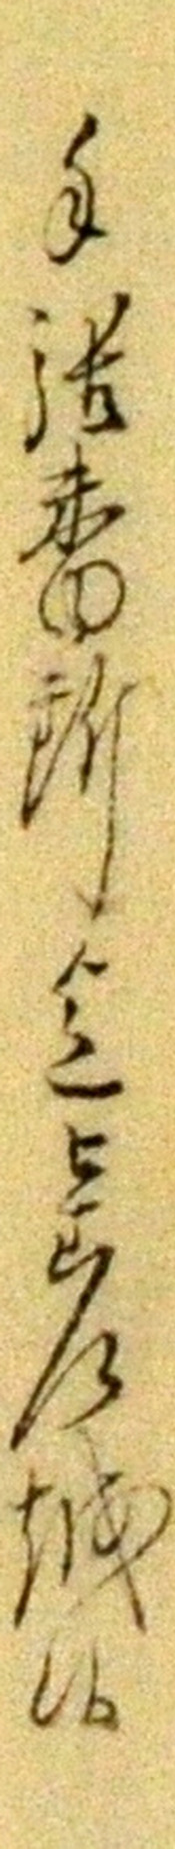手張番所迄被差越候
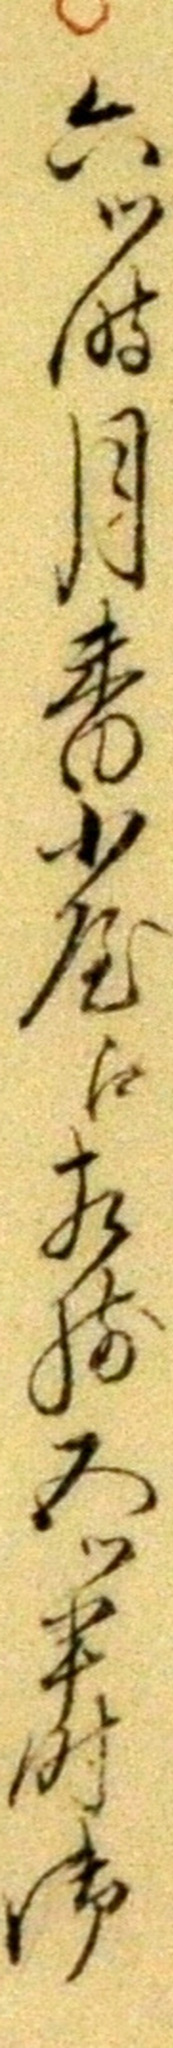六ツ時月番小屋え相揃五ツ半時御
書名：大阪加番関係諸書留〔一括〕
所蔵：伊那市立高遠町図書館・合同会社AMANE
